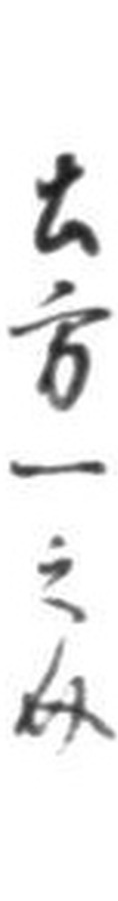土方一之介

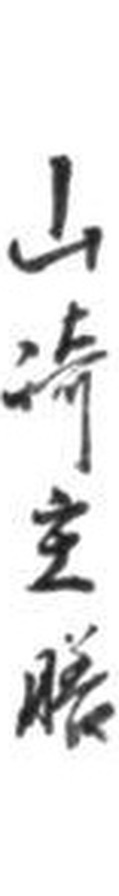山崎主膳
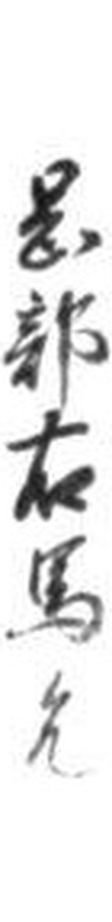岡部右馬允
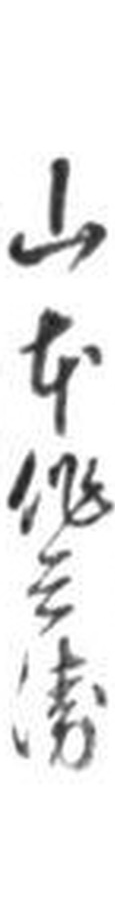山本作兵衛
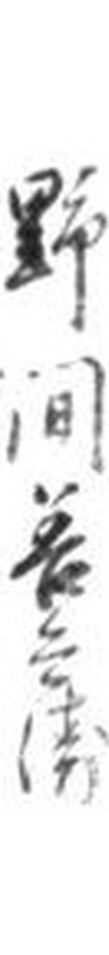野間善兵衛
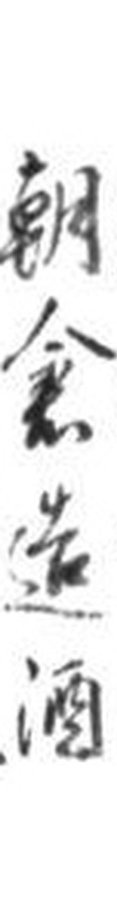朝倉造酒
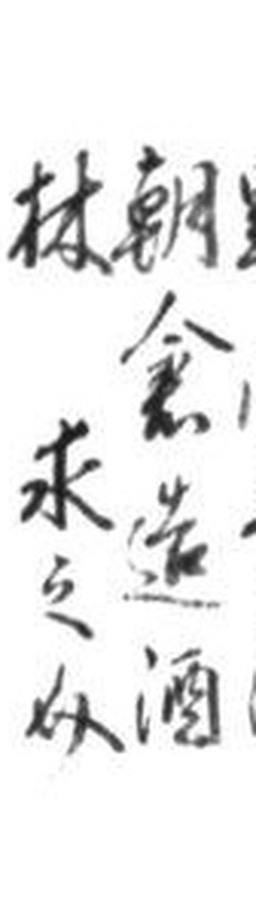林求之介
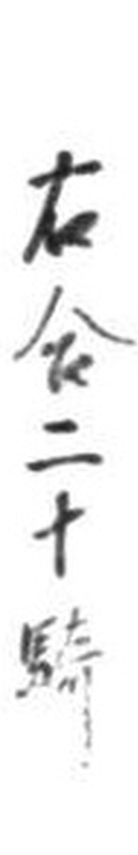右合二十騎
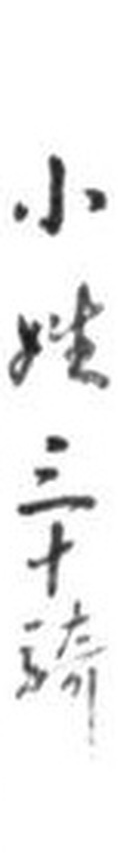小姓三十騎
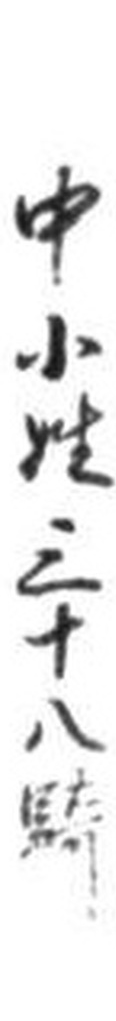中小姓三十八騎
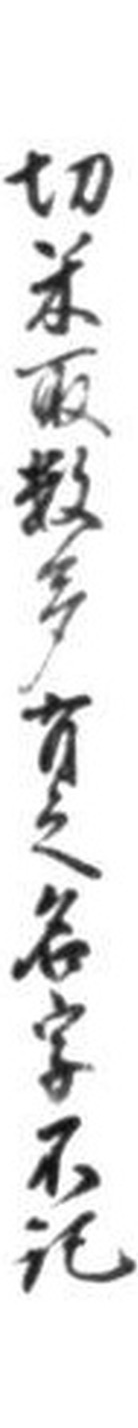切米取数多有之名字不記
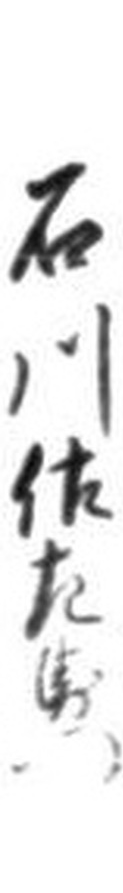石川佐左衛門
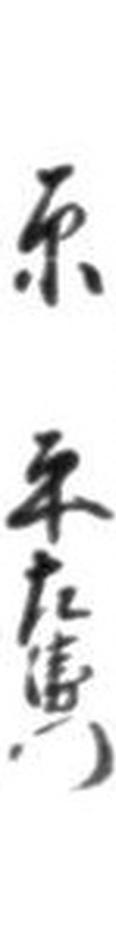原平左衛門
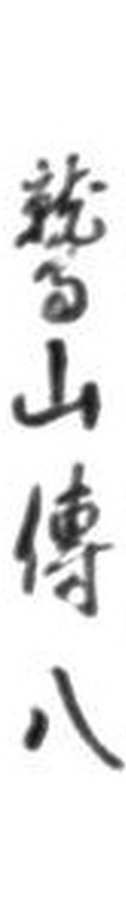鷲山伝八
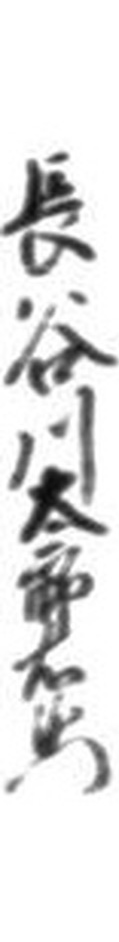長谷川太郎右衛門
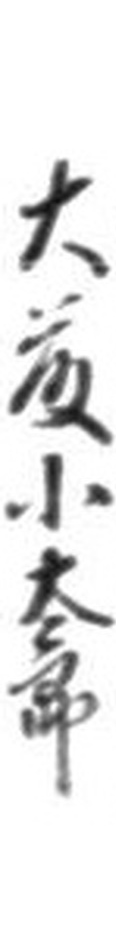大藤小太郎
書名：家譜 二 忠直公 従文禄四年到慶安四年
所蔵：福井県文書館 Fukui Prefectural Archives
